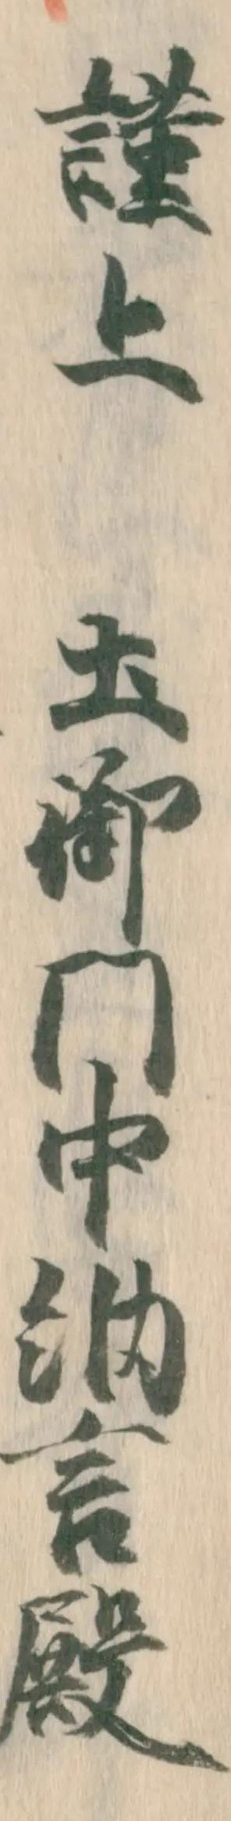謹上土御門中納言殿

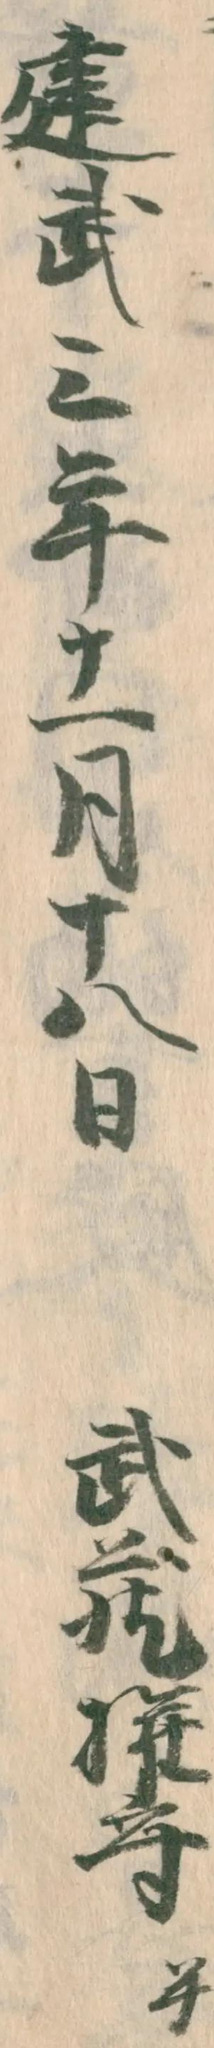建武三年十一月十八日武蔵権守判
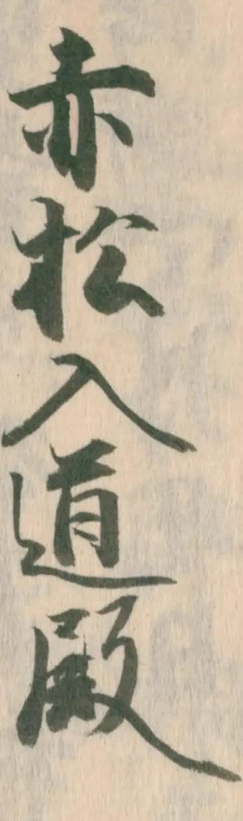赤松入道殿
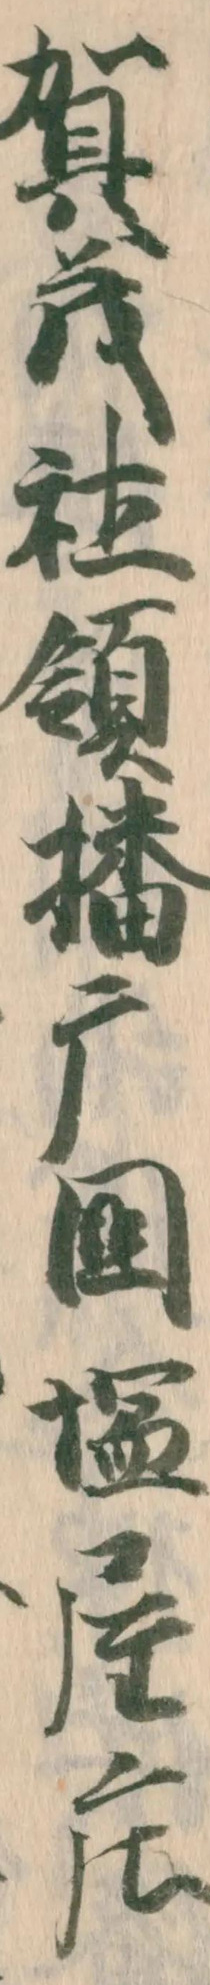賀茂社領播磨国塩屋庄
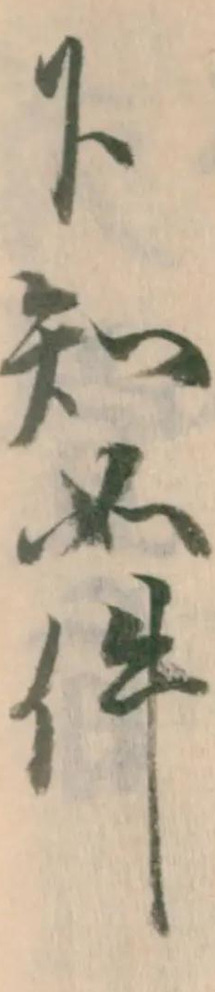下知如件
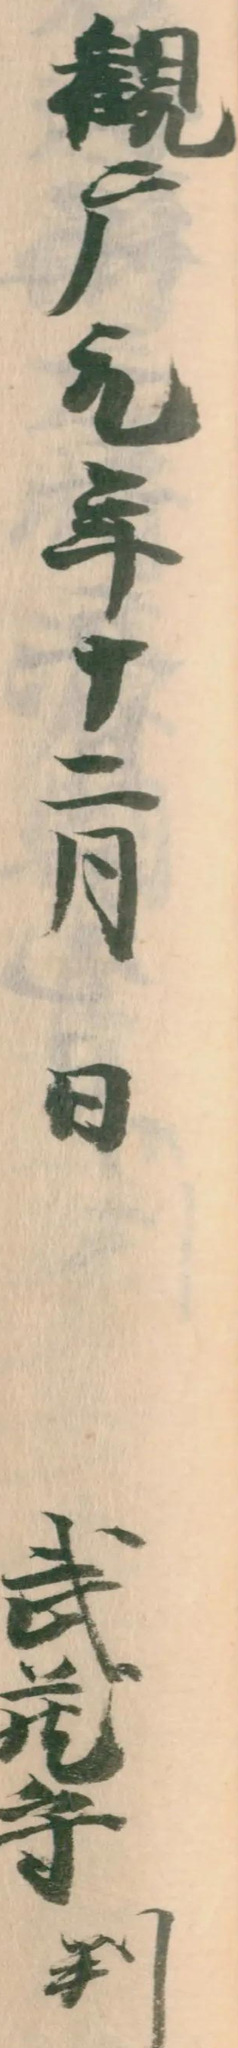観応元年十二月日武蔵守判
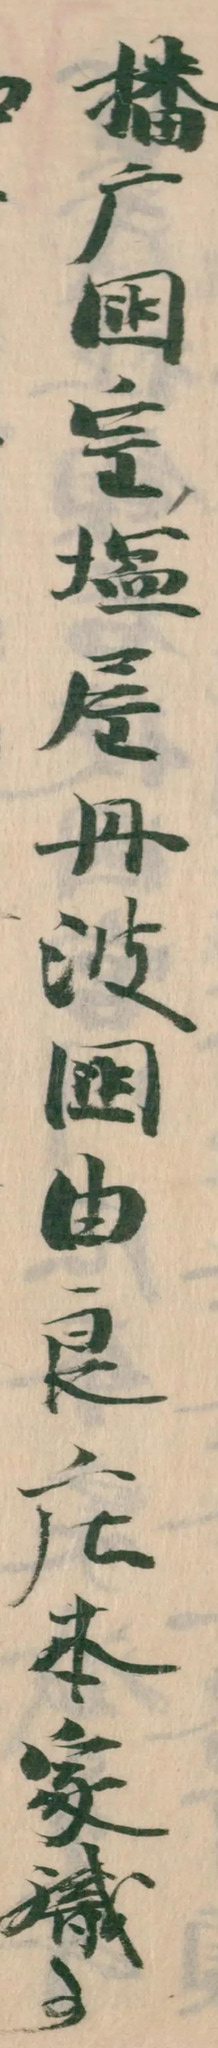播磨国室塩屋丹波国由良庄本家職事
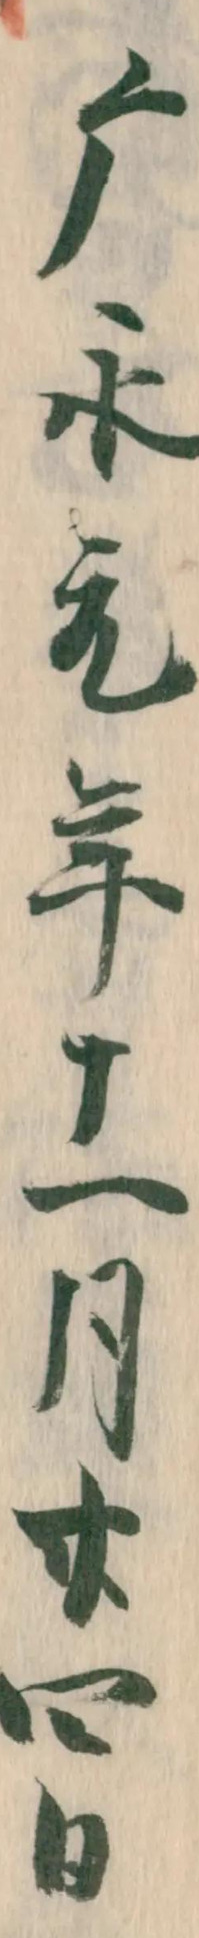応永元年十一月廿四日
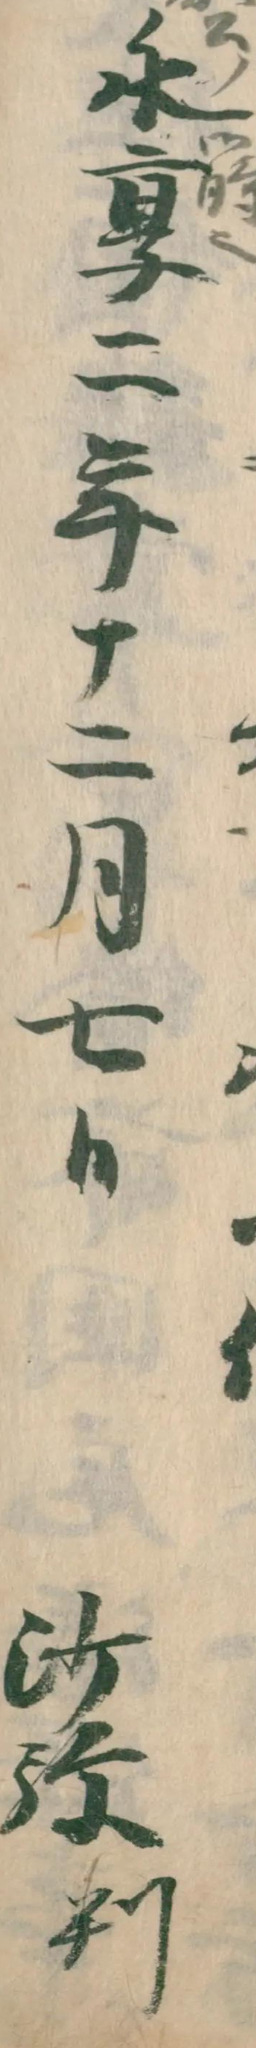永享二年十二月七日沙弥判

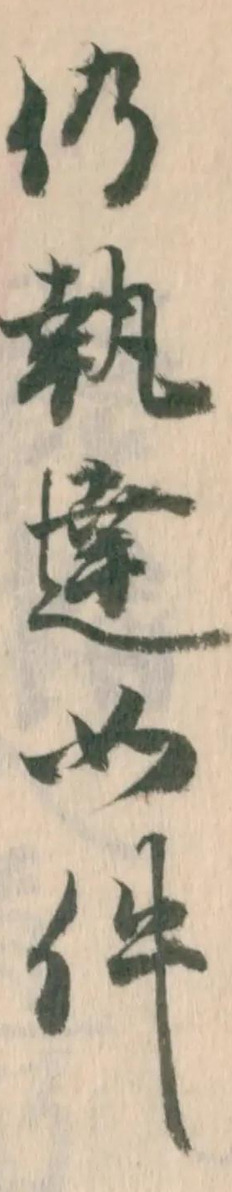仍執達如件
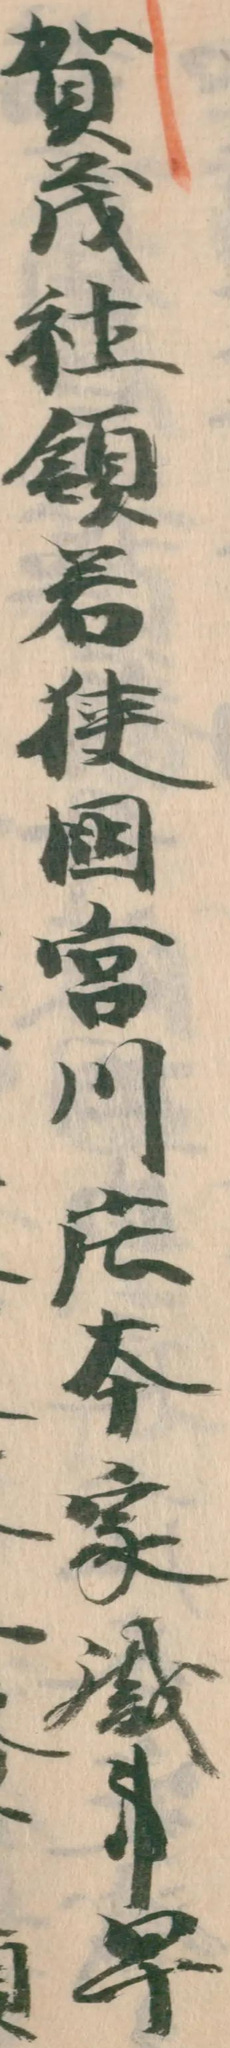賀茂社領若狭国宮川庄本家職事早
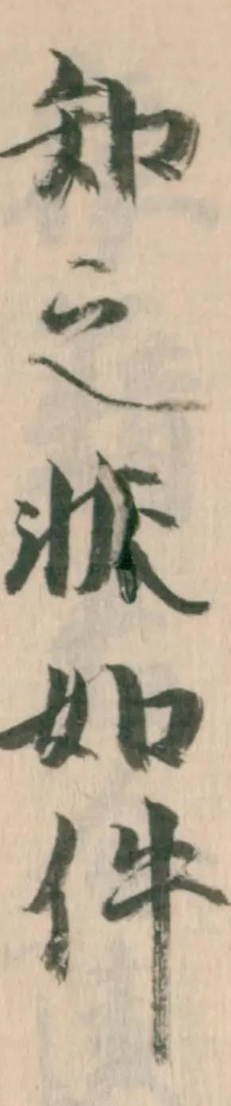知之状如件
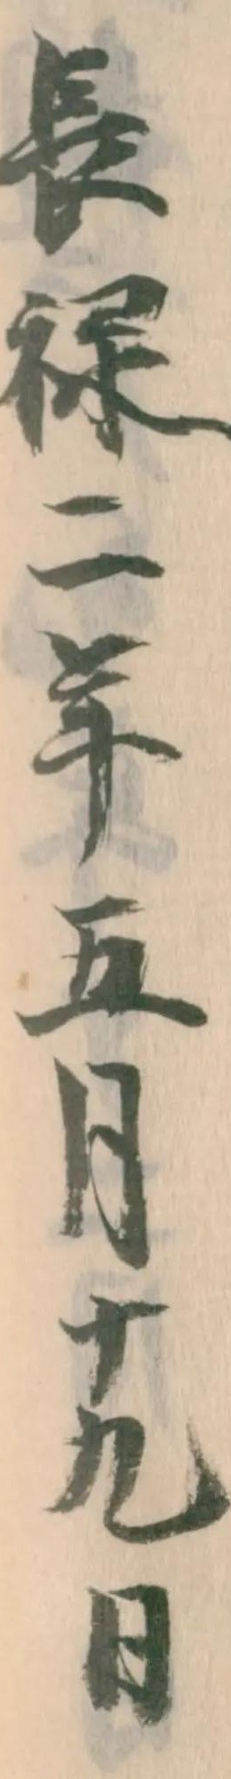長禄二年五月十九日
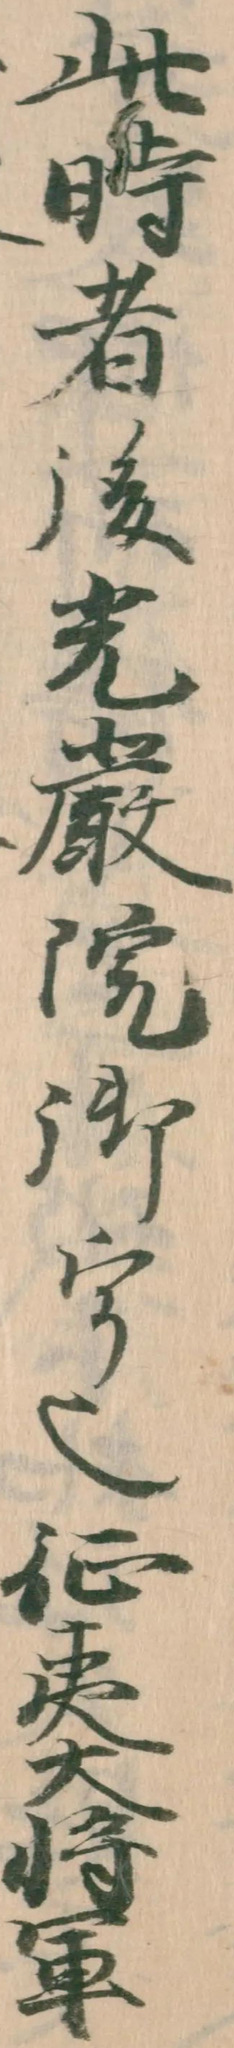此時者後光厳院御宇也征夷大将軍
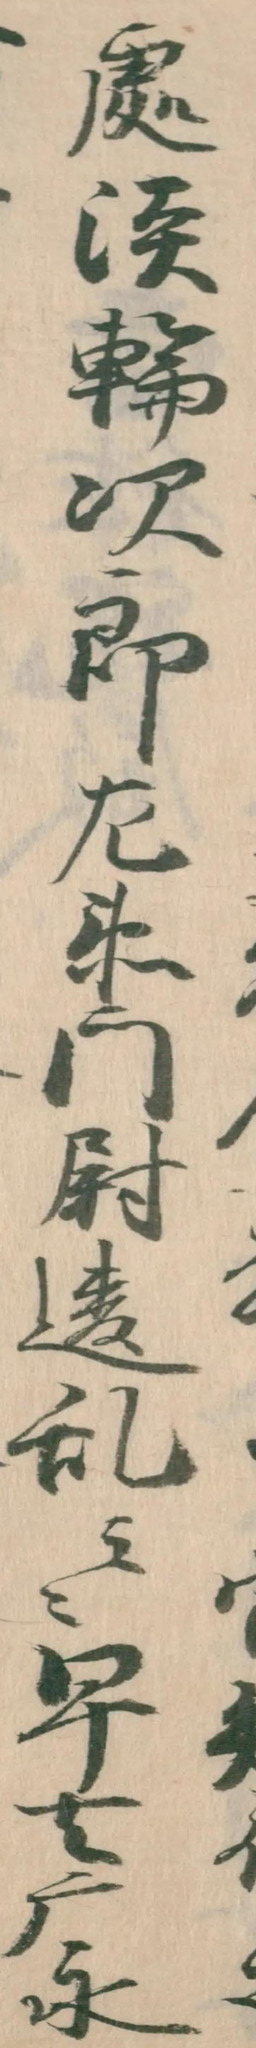処淡輪次郎左衛門尉違乱云々早去応永
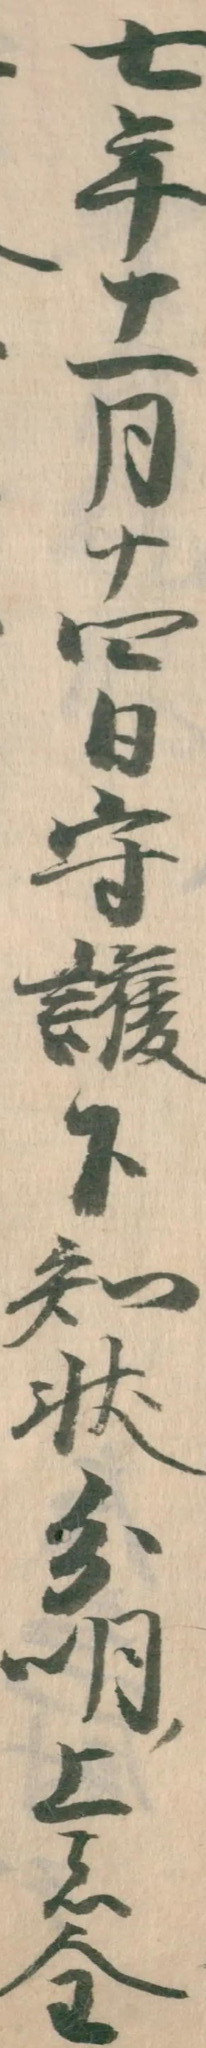七年十一月十四日守護下知状分明上者全
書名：賀茂社記録. 第1冊
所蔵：国立国会図書館 National Diet Library, JAPAN
